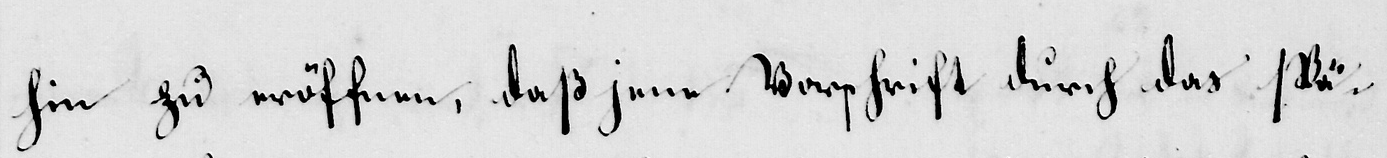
hin zu eröffnen, daß jene Vorschrift durch das spä¬
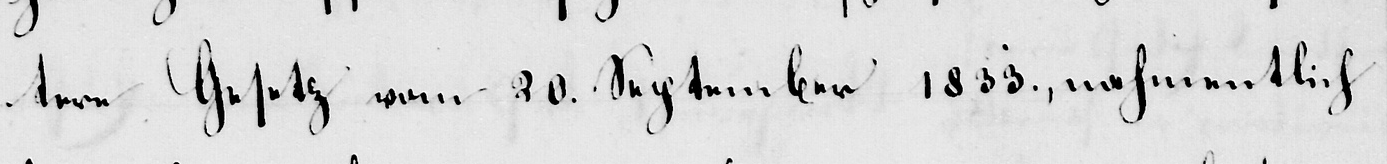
tere Gesetz vom 20. September 1833., nahmentlich
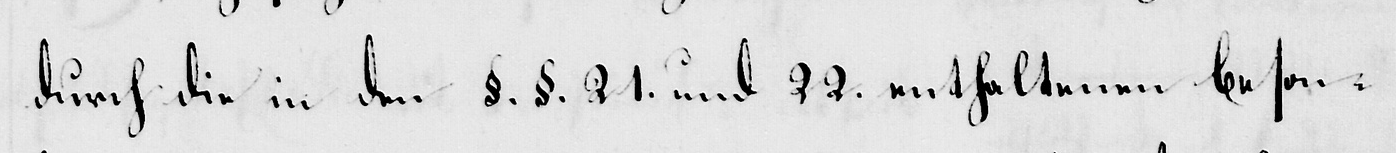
durch die in den §. §. 21. und 22. enthaltenen beson¬
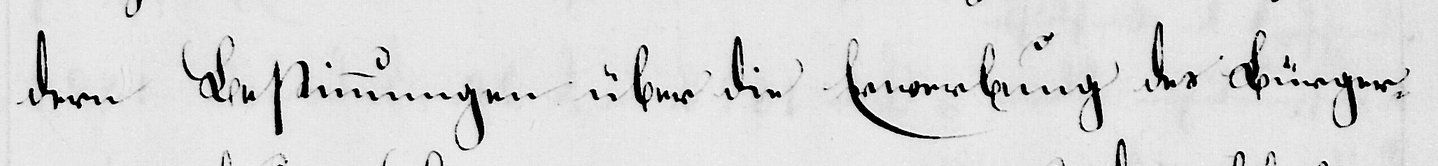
dern Bestimmungen über die Erwerbung des Bürger¬
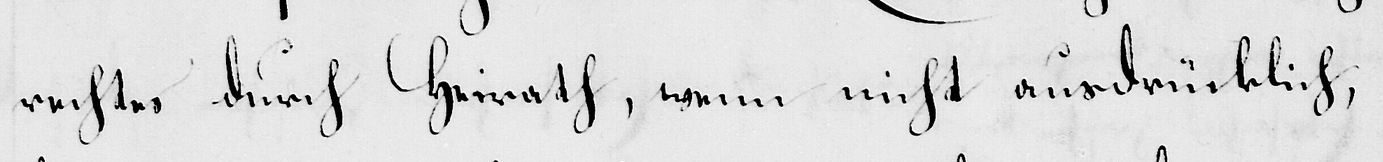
rechtes durch Heirath, wenn nicht ausdrücklich,
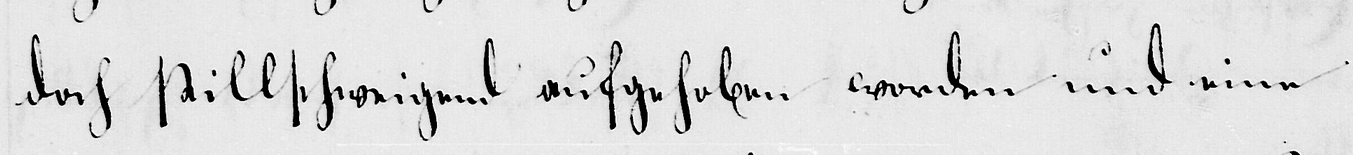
doch stillschweigend aufgehoben worden und eine
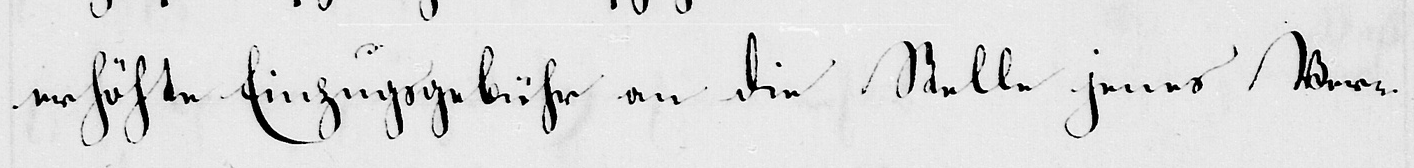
erhöhte Einzugsgebühr an die Stelle jenes Ver¬
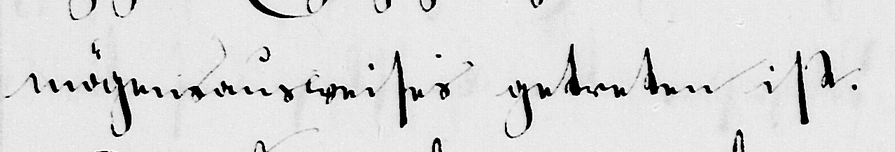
mögensausweises getreten ist.
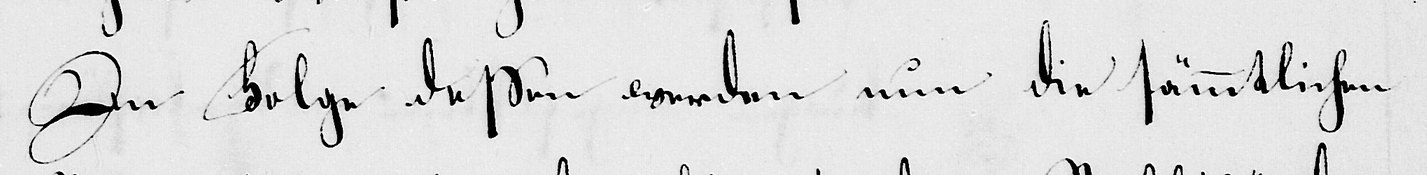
In Folge dessen werden nun die sämmtlichen
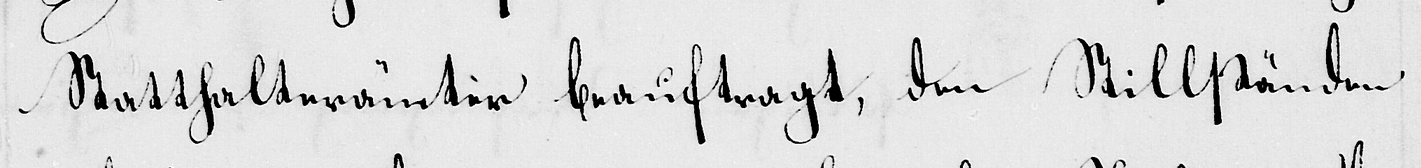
Statthalterämter beauftragt, den Stillständen
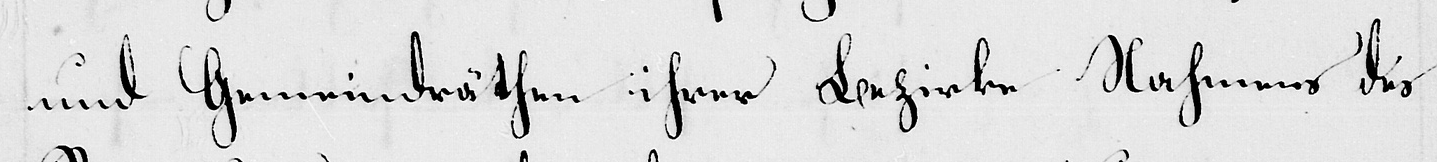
und Gemeindräthen ihrer Bezirke Nahmens des
